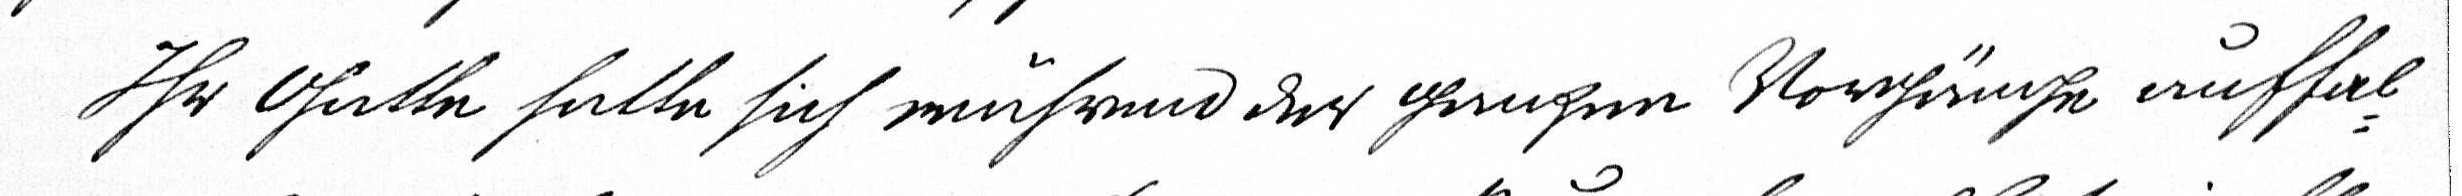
Ihr Gatte hatte sich während der ganzen Vorgänge auffal¬
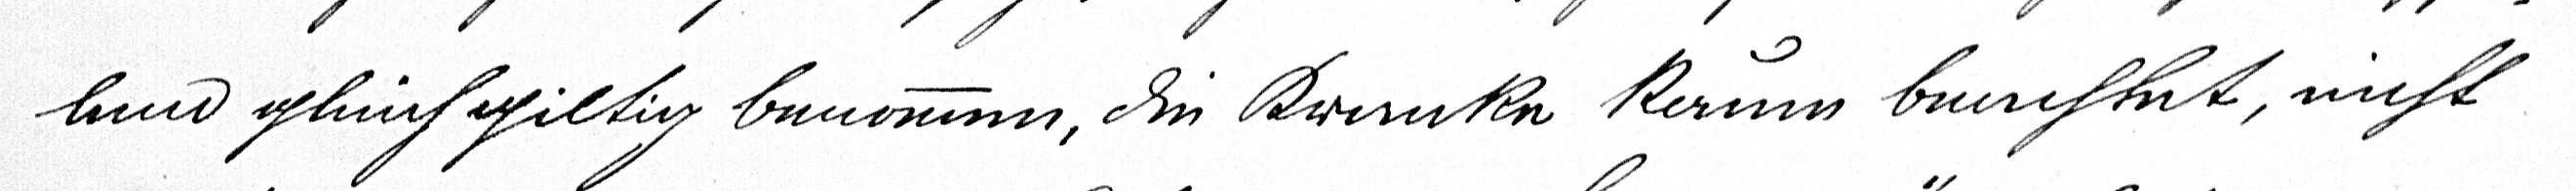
end gleichgiltig benommen. Die kranke kaum beachtet, nicht
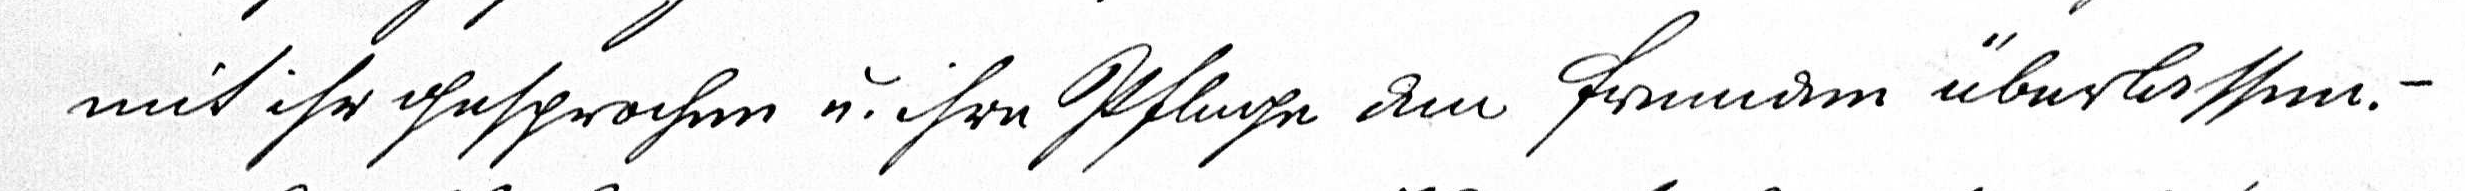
mit ihr gesprochen u ihre Pflege den Fremden überlassen.
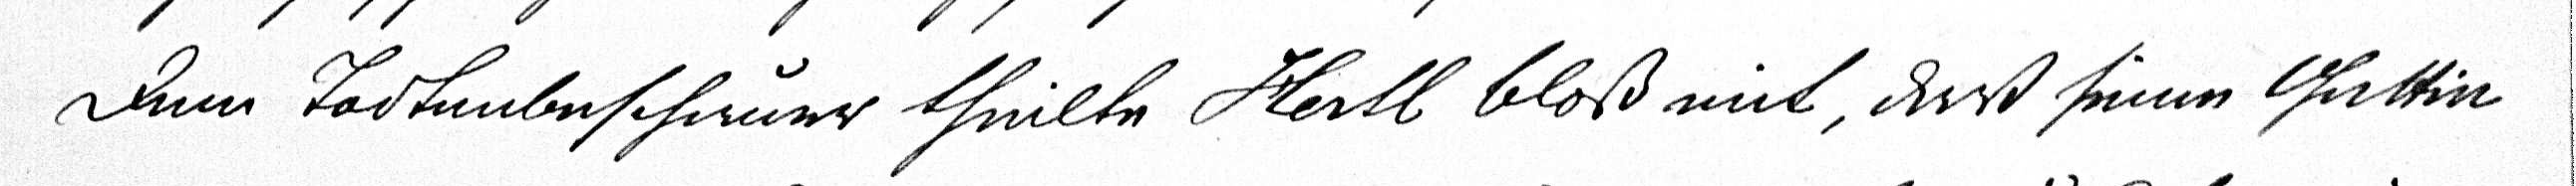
Dem Todtenbeschauer theilte Hertl bloß mit, daß seine Gattin
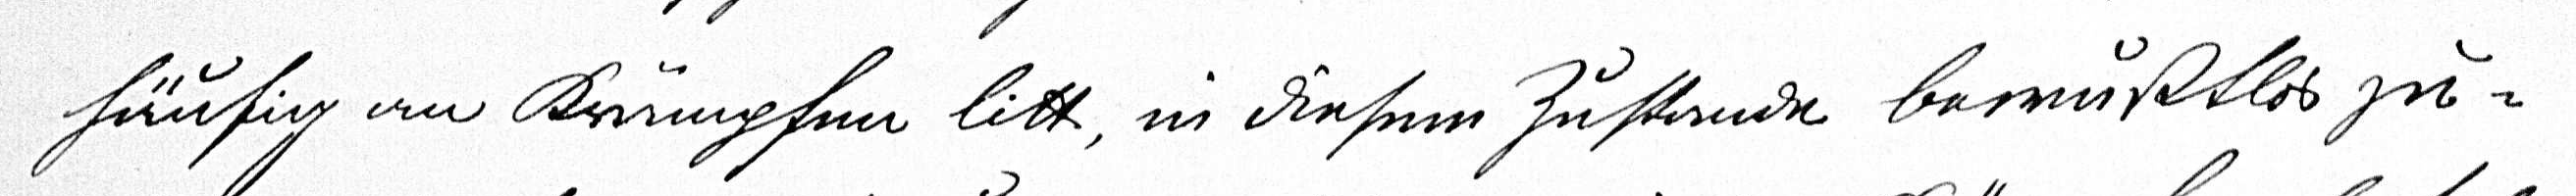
häufig an Krämpfen litt, in diesem Zustande bewußtlos zu¬
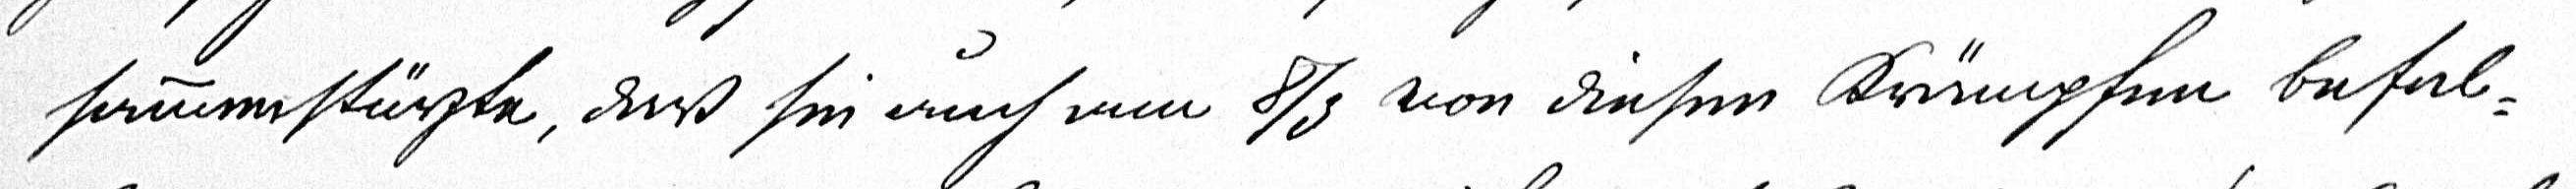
sammenstürzte, daß sie auch vom 8/3 von diesen Krämpfen befal¬
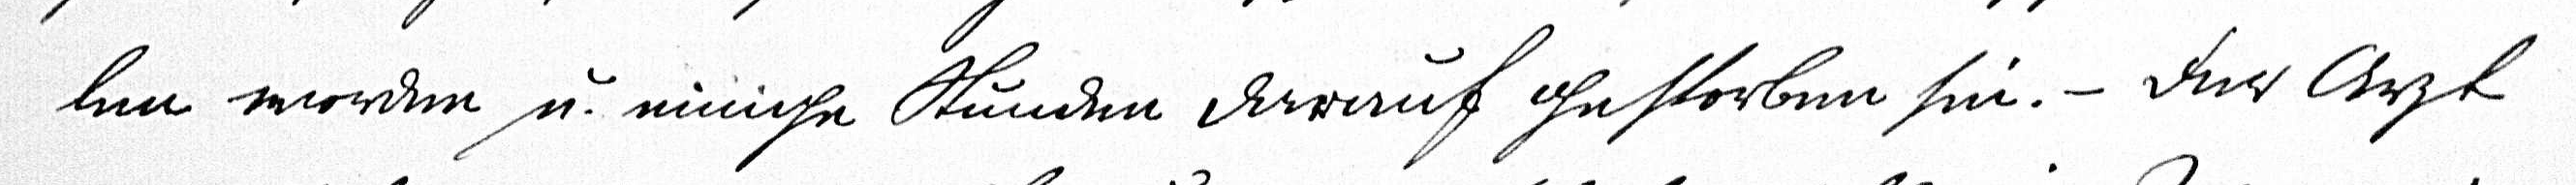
len worden u. einige Stunden darauf gestorben sei. Der Arzt
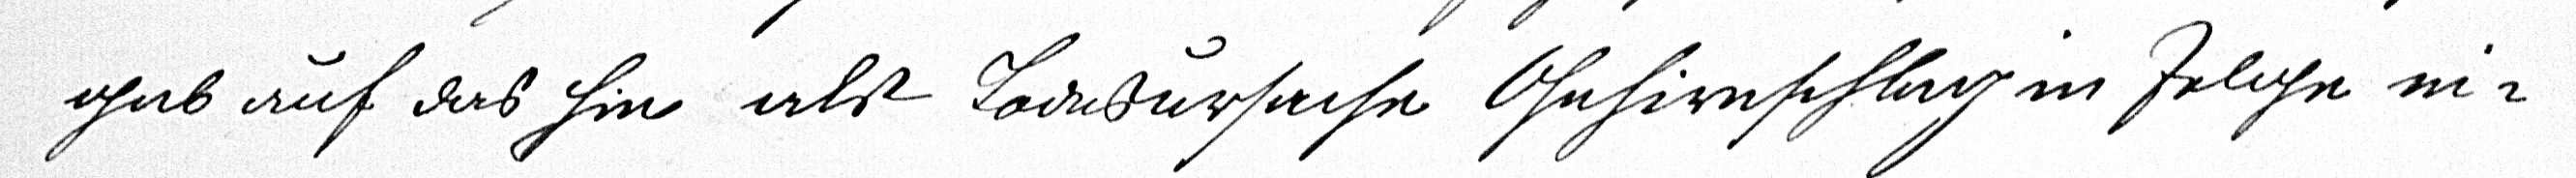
gab auf das hin als Todesursache Gehirnschlag in Folge ei¬
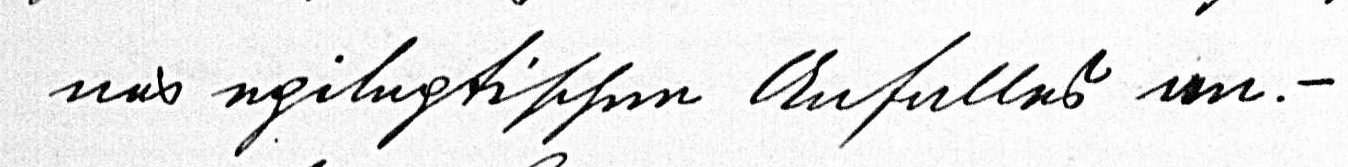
nes epileptischen Anfalles an.
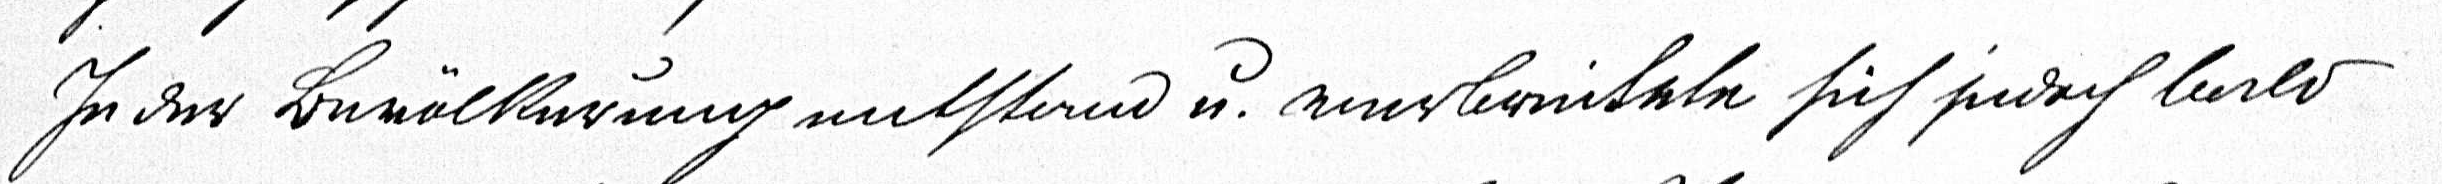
In der Bevölkerung entstand u. verbreitete sich jedoch bald
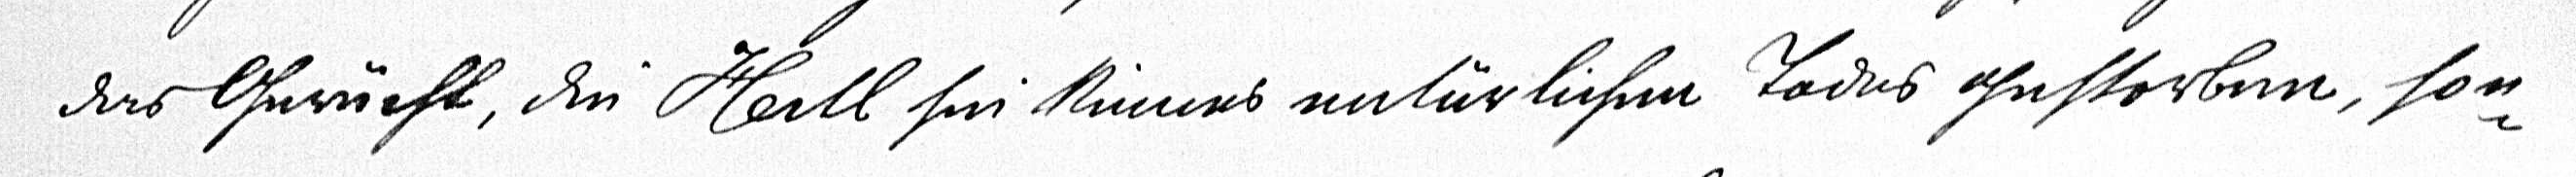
das Gerücht, die Hertl sei keines natürlichen Todes gestorben, son¬
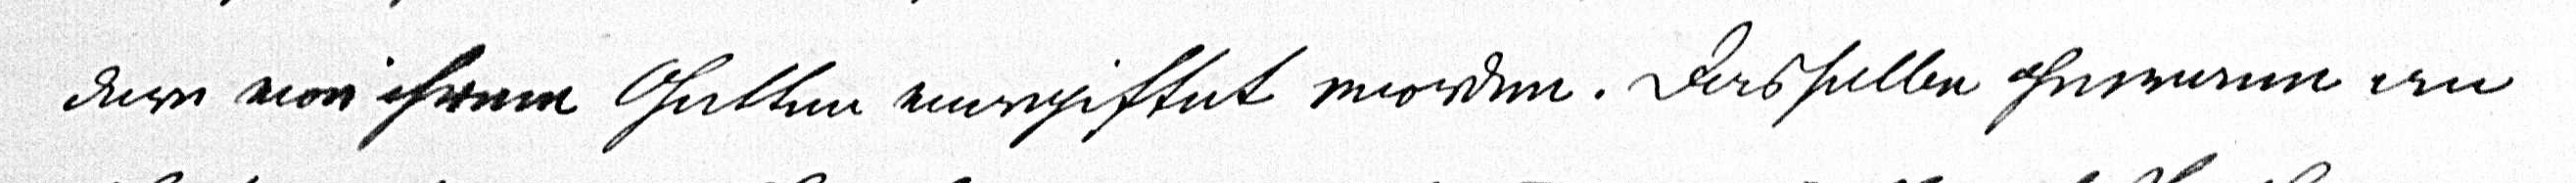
dern von ihrem Gatten vergiftet worden. Dasselben gewann an
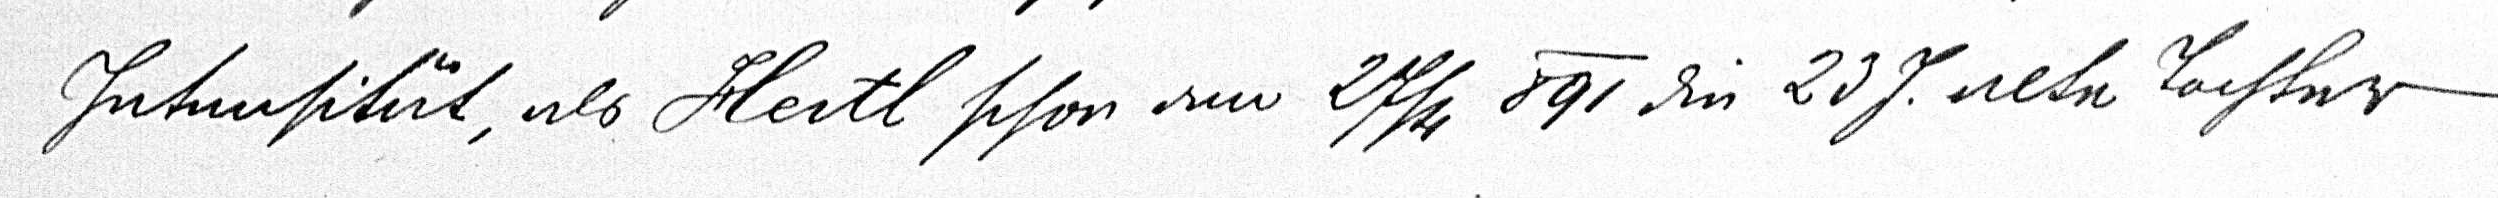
Intensität, als Hertl schon am 27.4.1891 die 23 J. alte Tochter
